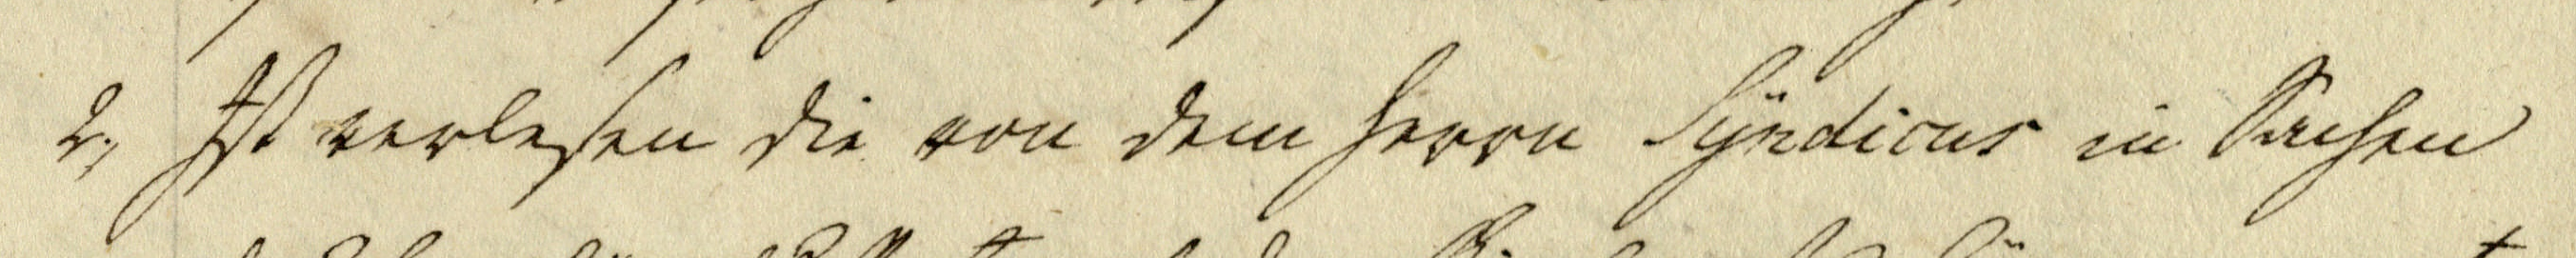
2., Ist verlesen die von dem Herrn Sÿndicus in Sachen
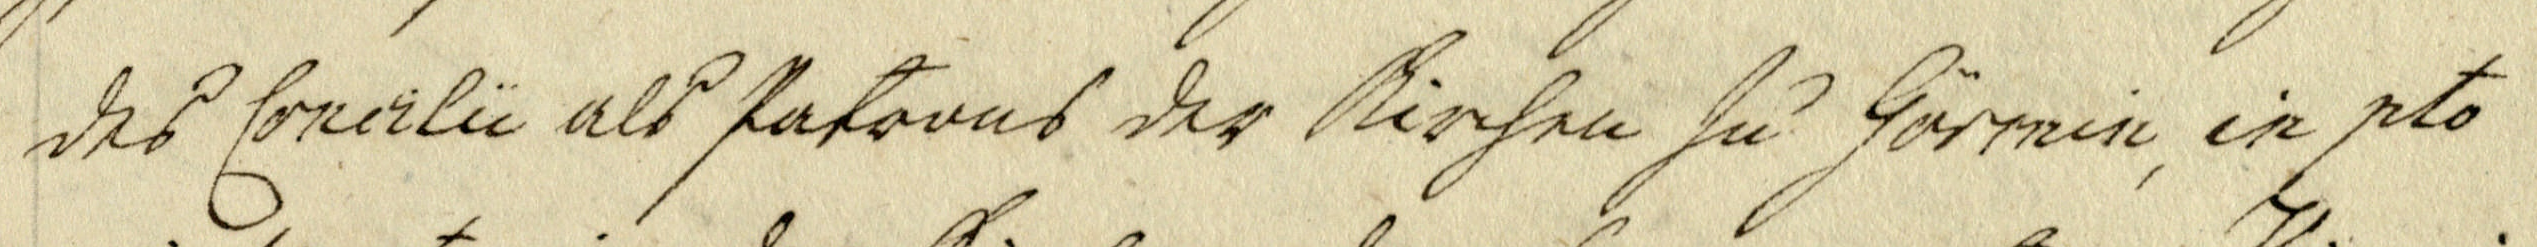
des Concilii als Patrons der Kirchen zu Görmin in pto
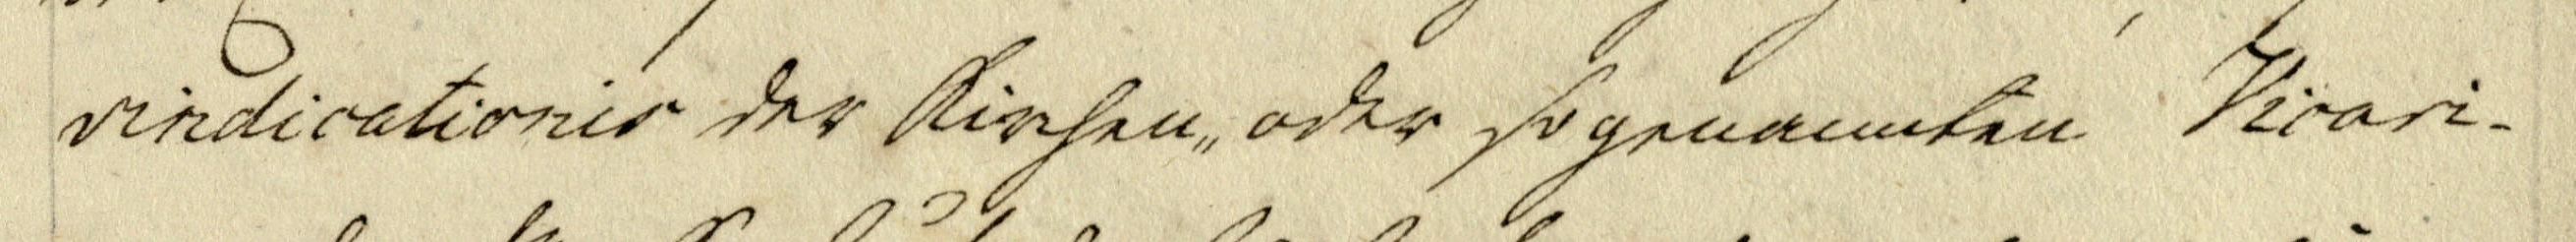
vindicationis der Kirchen, oder so genannten Vicari¬
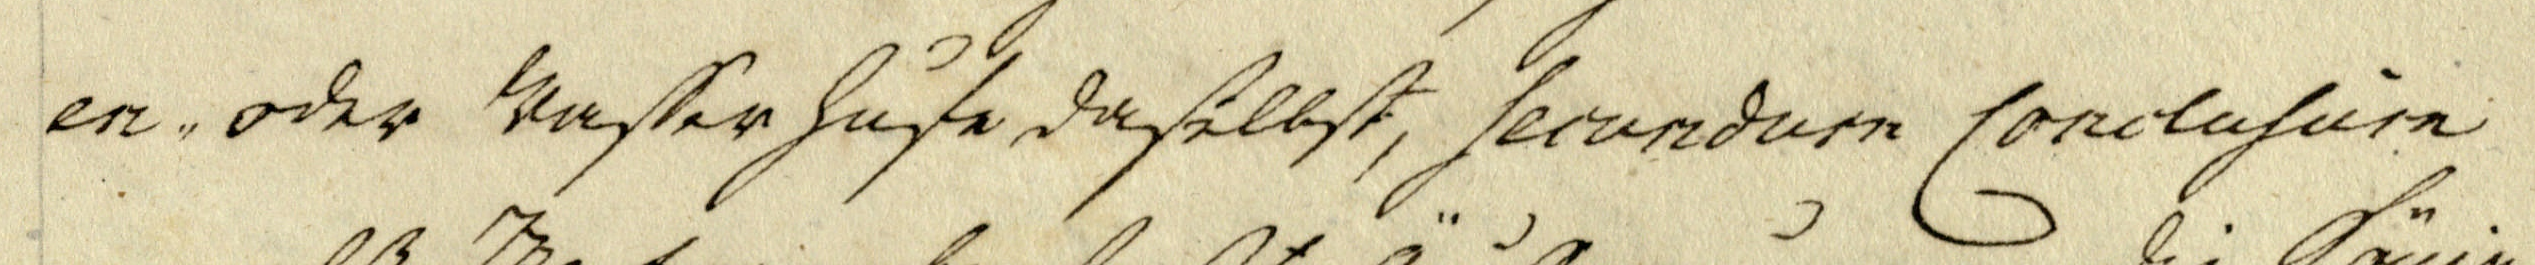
en, oder Wasser Hufe daselbst, secundum Conclusum
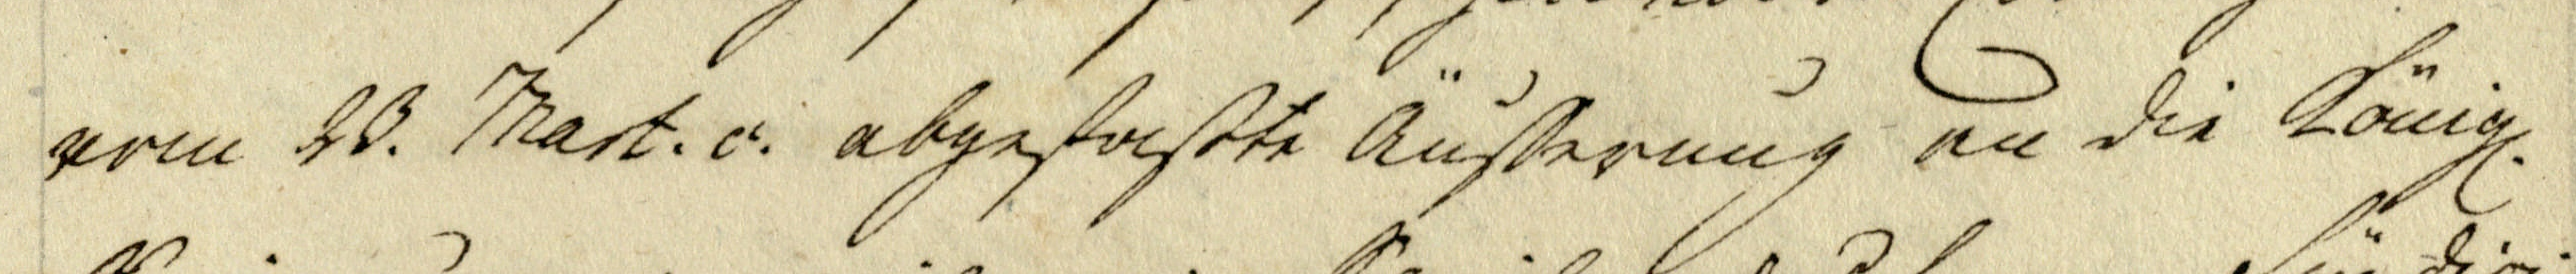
vom 23. Mart. c. abgefaßte Äusserung an die Königl.
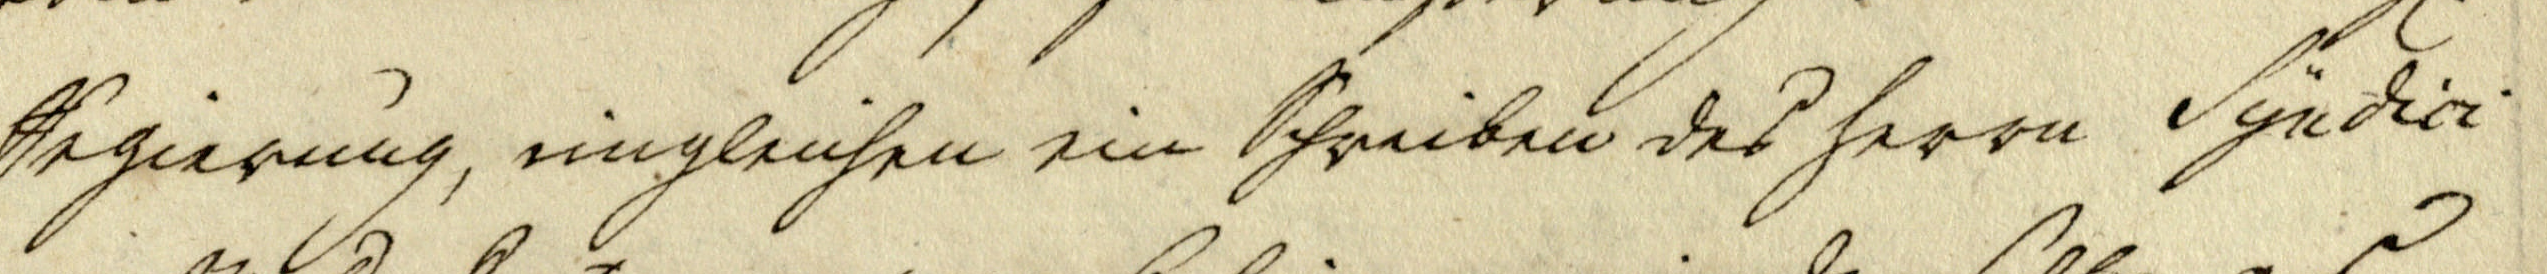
Regierung, imgleichen ein Schreiben des Herrn Sÿndici
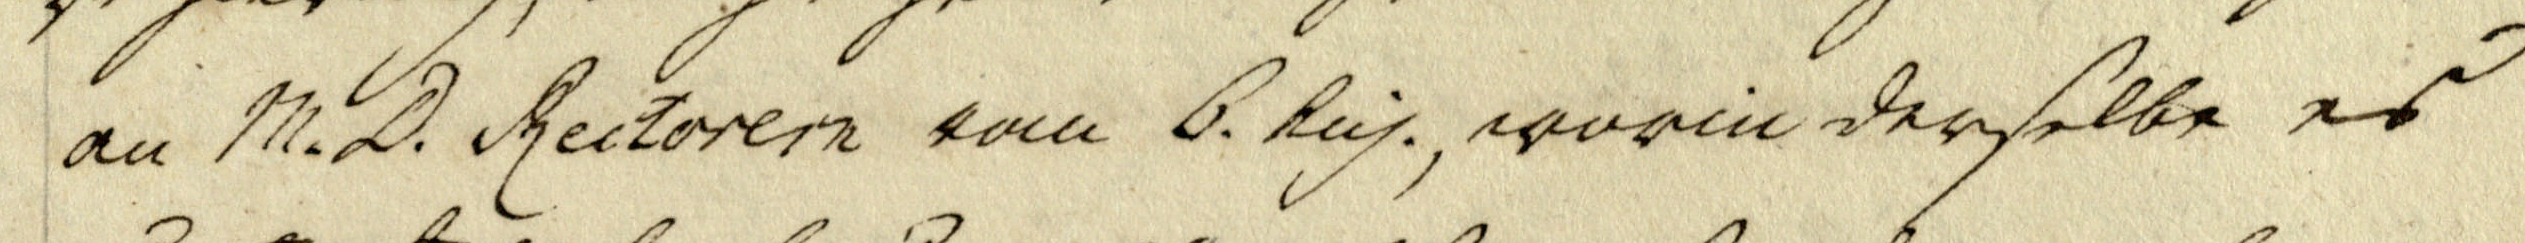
an M. D. Rectorem vom 6. huj., worin derselbe es
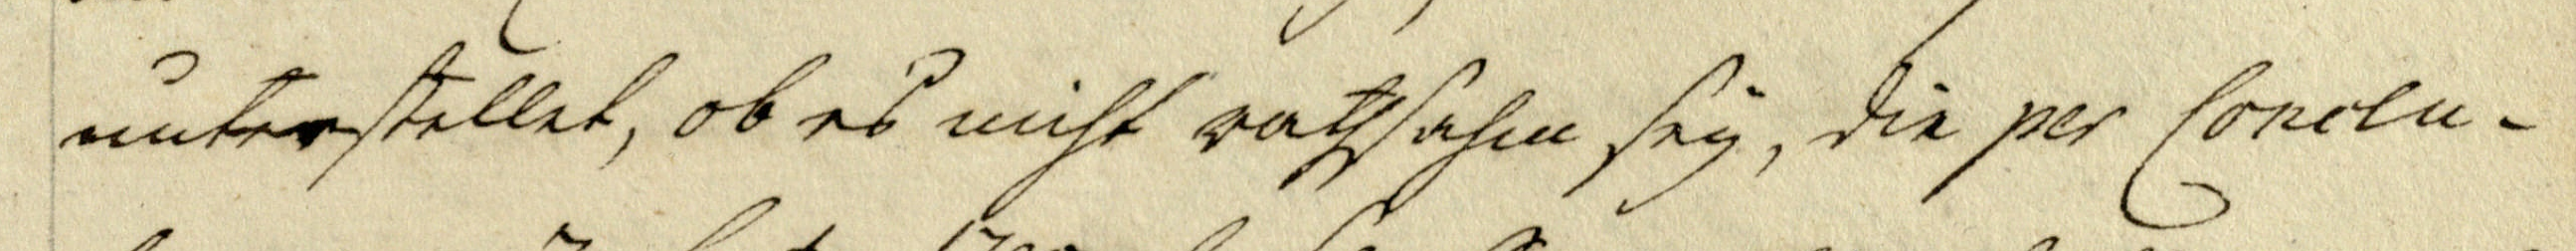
unterstellet, ob es nicht rathsahm seÿ, die per Conclu¬
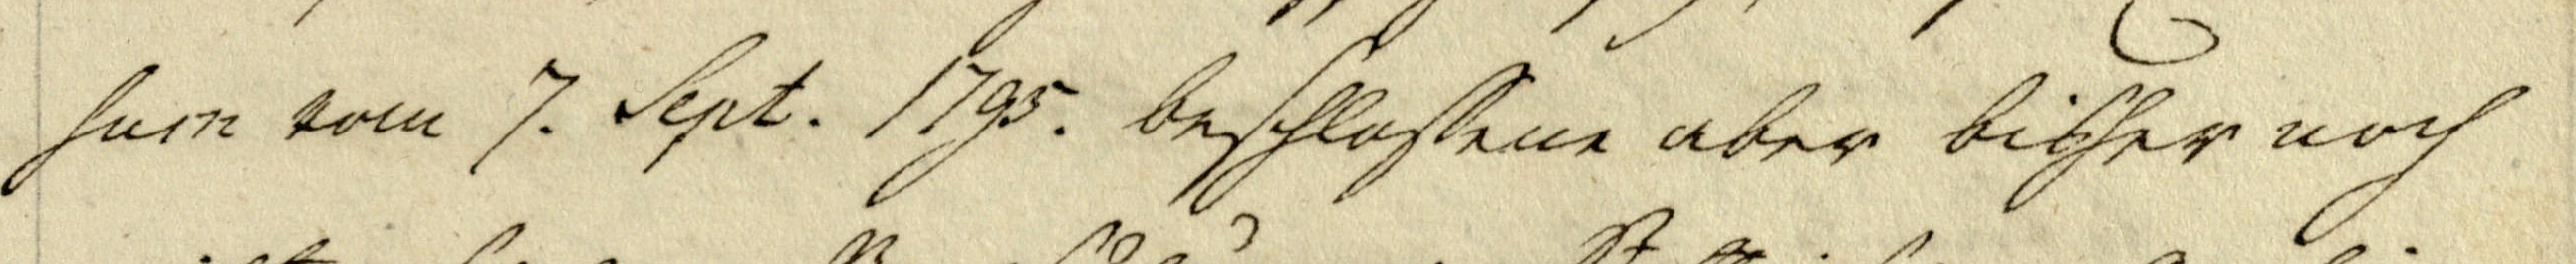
sum vom 7. Sept. 1795. beschlossene aber bisher noch
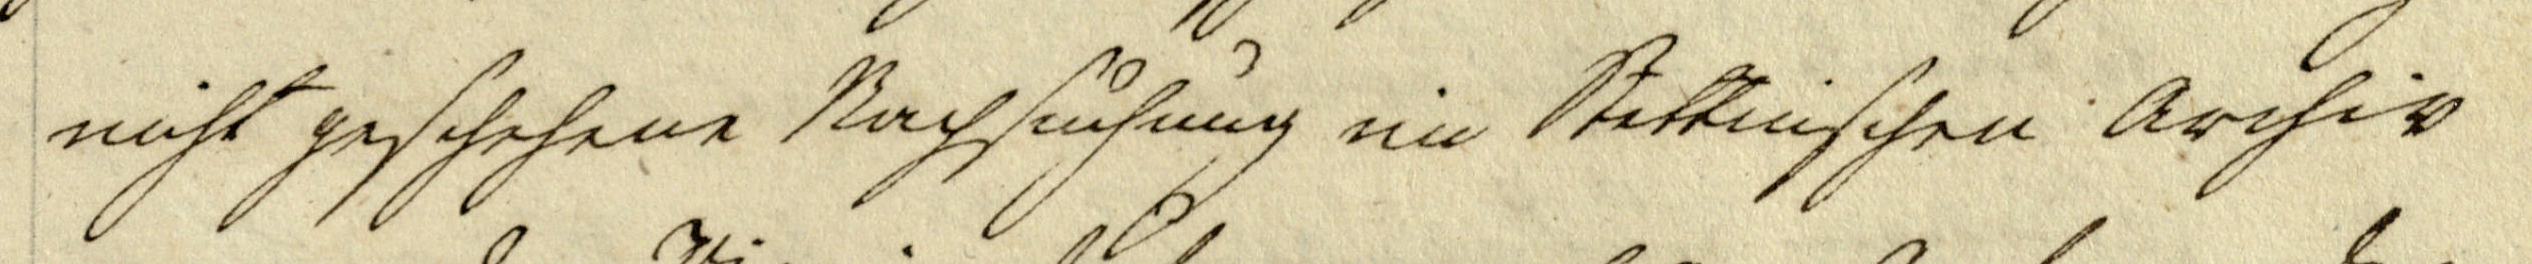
nicht geschehene Nachsuchung im Stettinschen Archiv
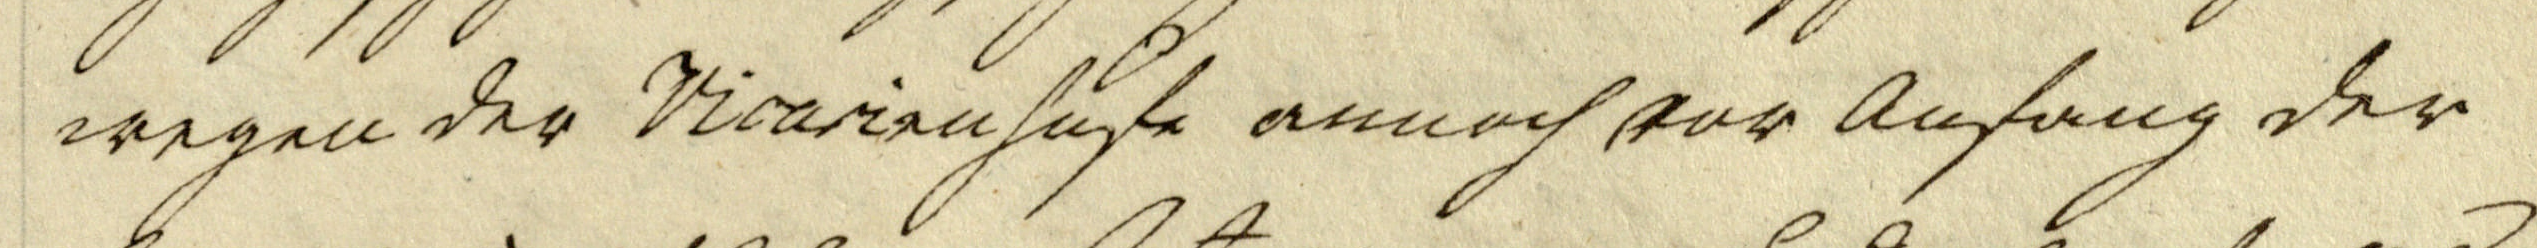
wegen der Vicarienhufe annoch vor Anfang der
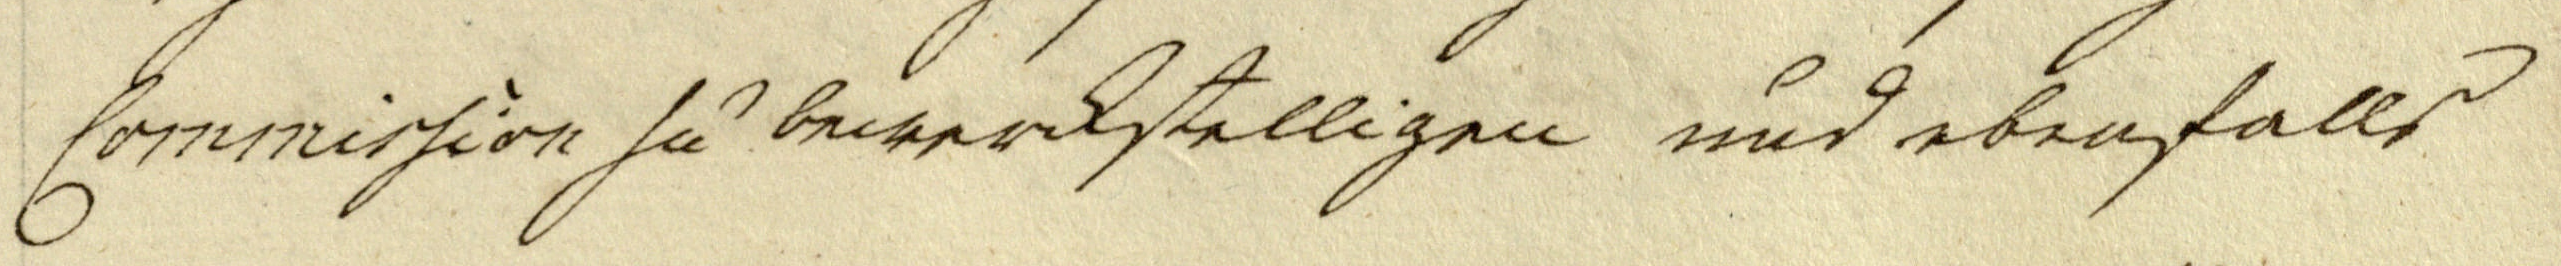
Commission zu bewerckstelligen und ebenfalls
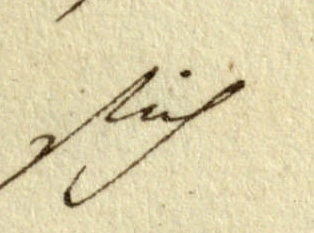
sich
